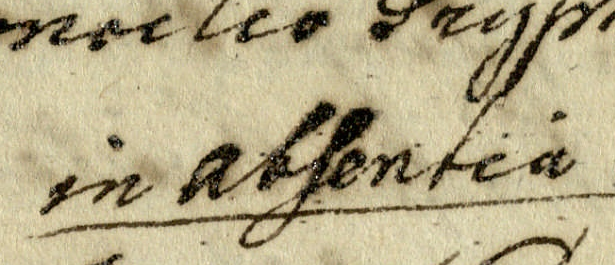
in absentia
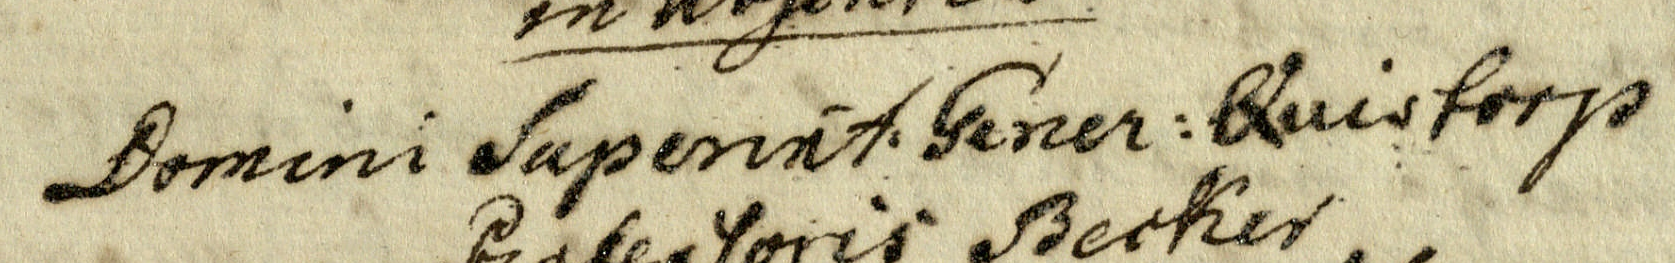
Domini Sperint. Gener. Quistorp
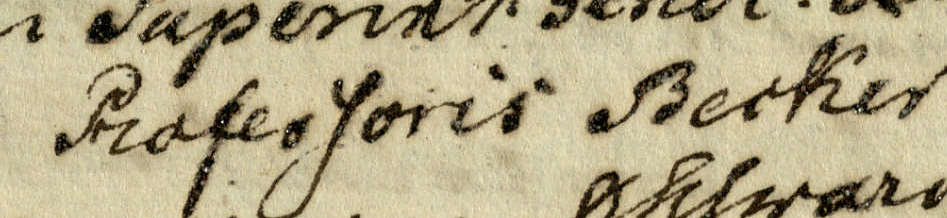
Professoris Becker
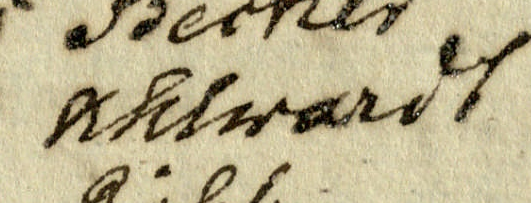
Ahlwardt.
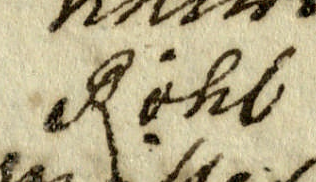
Röhl.
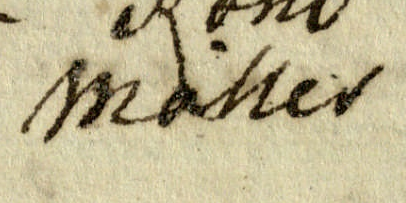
Möller.
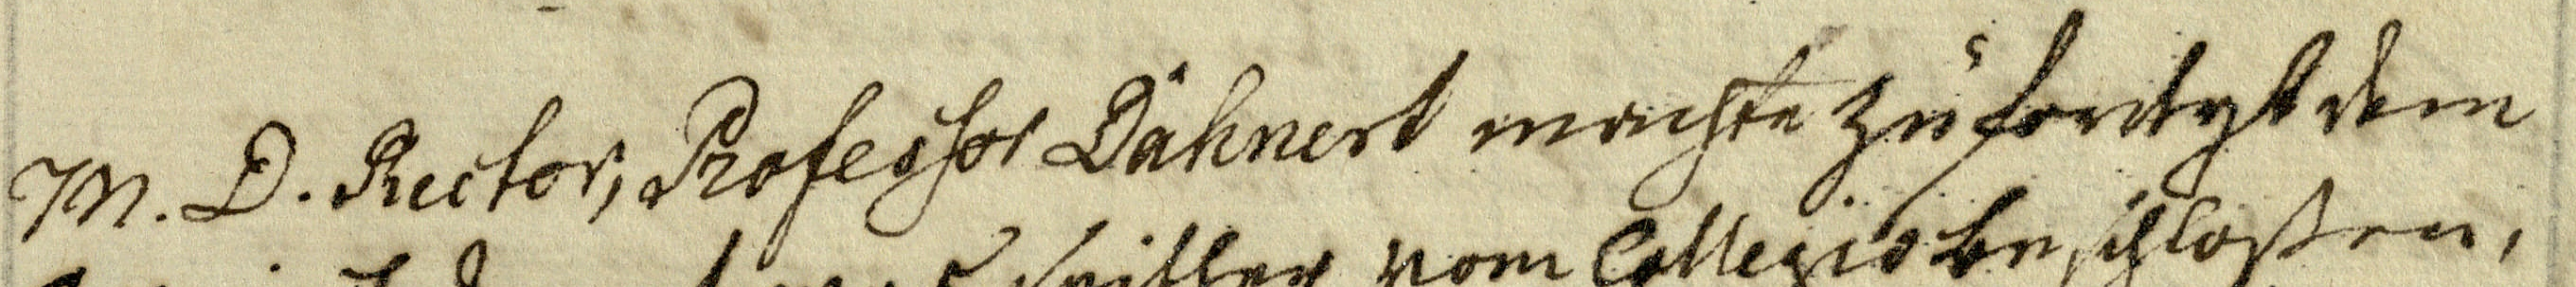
M. D. Rector, Professor Dähnert machte zuforderst dem
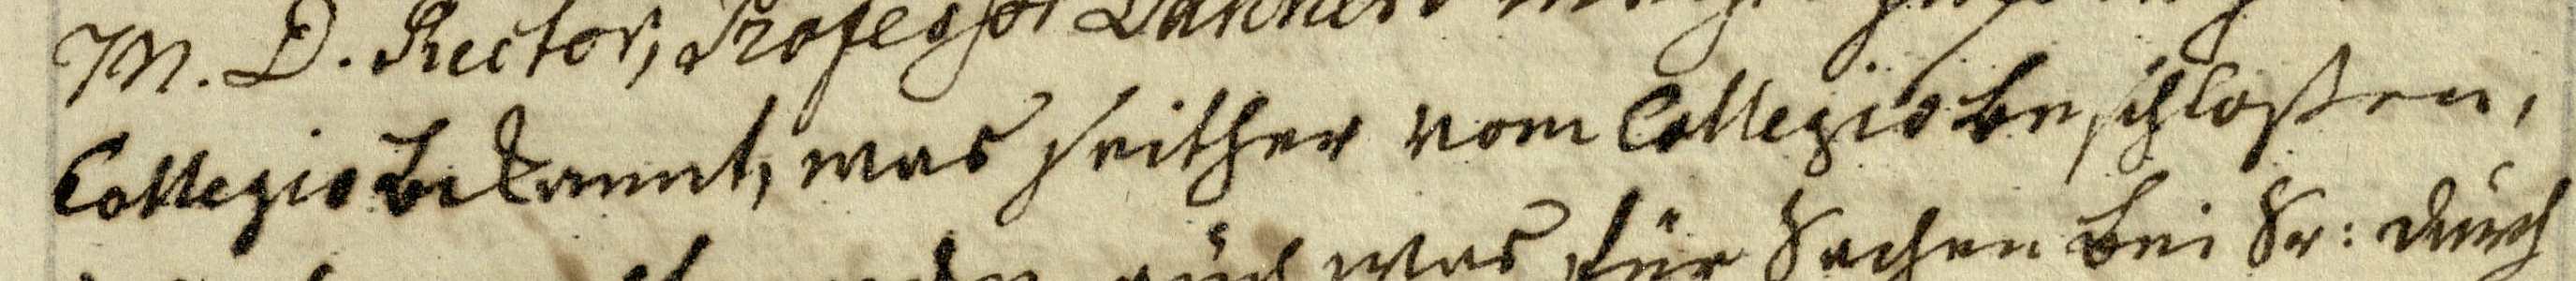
Collegio bekannt, was seither vom Collegio beschloßen,
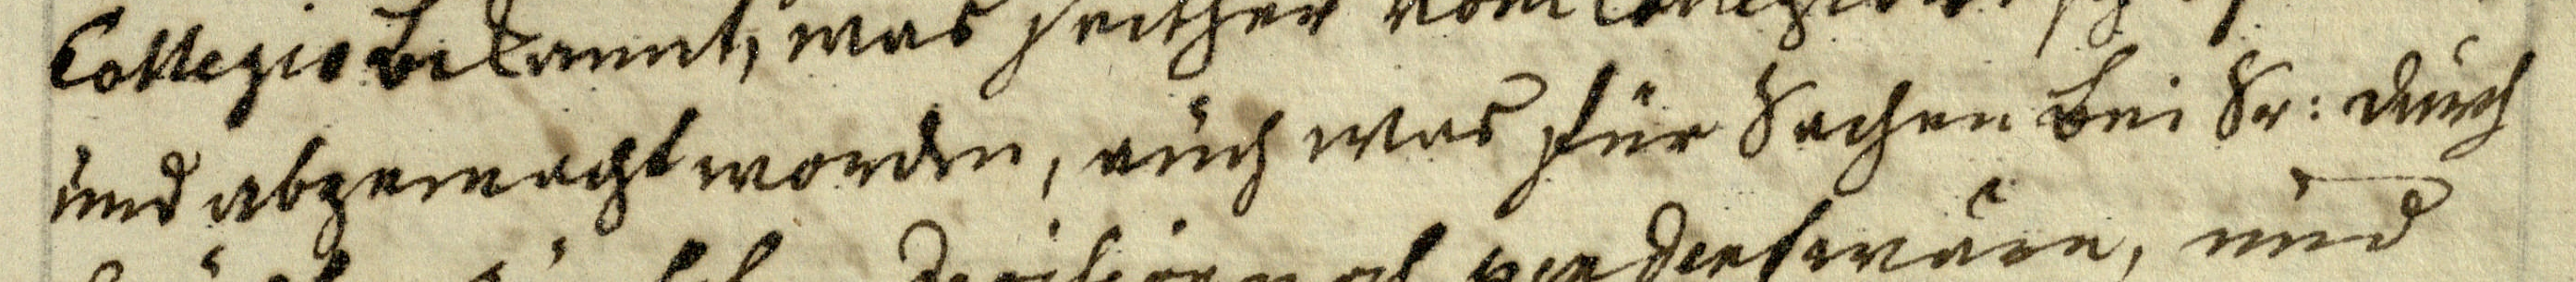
und abgemacht worden, auch was für Sachen bei Sr. Durch¬
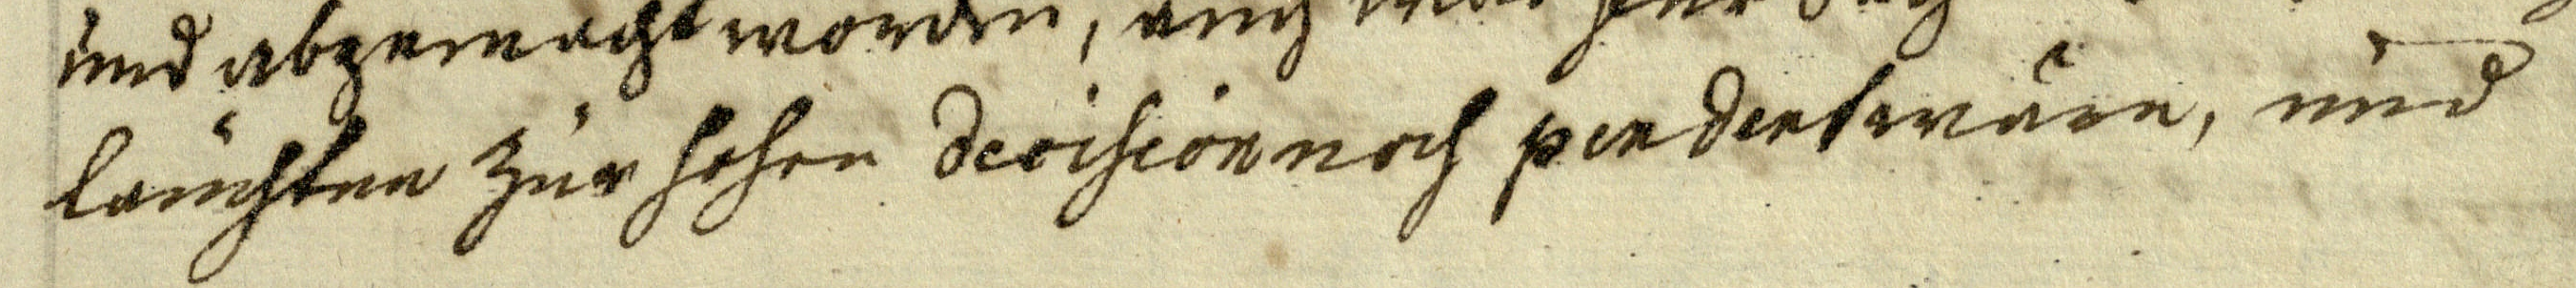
lauchten zur hohen decision noch pendent wäre, und
